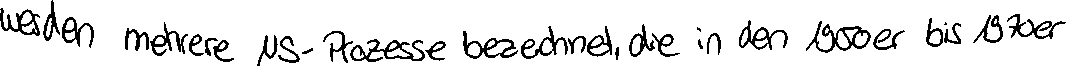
werden mehrere NS-Prozesse bezeichnet, die in den 1950er bis 1970er
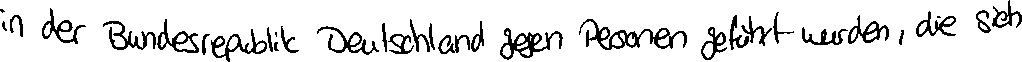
in der Bundesrepublik Deutschland gegen Personen geführt wurden, die sich
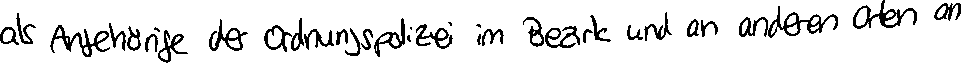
als Angehörige der Ordnungspolizei im Bezirk und an anderen Orten an
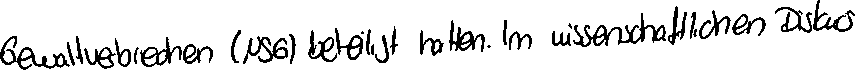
Gewaltverbrechen (NSG) beteiligt hatten. Im wissenschaftlichen Diskurs
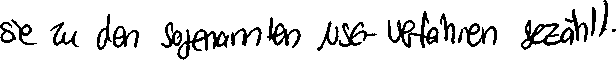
sie zu den sogenannten NSG-Verfahren gezählt.
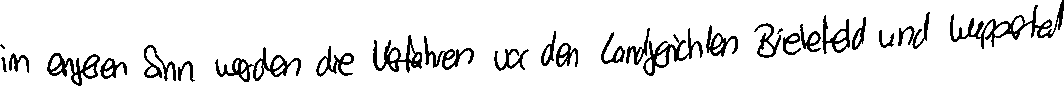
im engeren Sinn werden die Verfahren vor den Landgerichten Bielefeld und Wuppertal
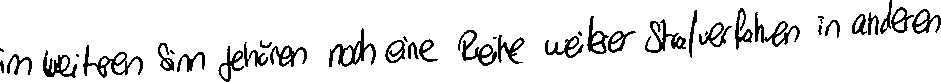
im weiteren Sinne gehören noch eine Reihe weiterer Strafverfahren in anderen
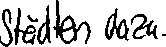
Städten dazu.
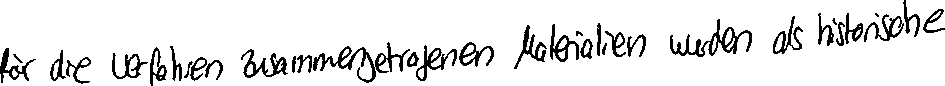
für die Verfahren zusammengetragenen Materialien wurden als historische
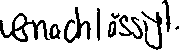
vernachlässigt.
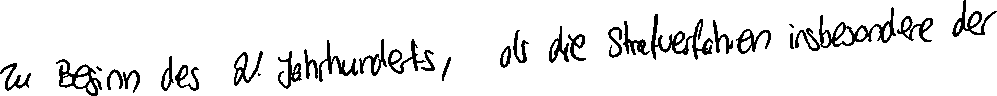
zu Beginn des 21. Jahrhunderts, als die Strafverfahren insbesondere der
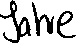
Jahre
